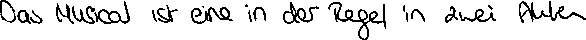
Das Musical ist eine in der Regel in zwei Akten
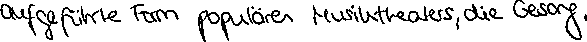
aufgeführte Form populären Musiktheaters, die Gesang,
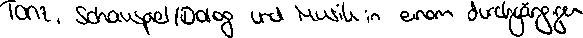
Tanz, Schauspiel/Dialog und Musik in einem durchgängigen
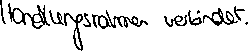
Handlungsrahmen verbindet.
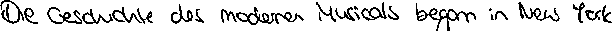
Die Geschichte des modernen Musicals begann im New York
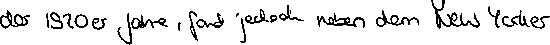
der 1920er Jahre, fand jedoch neben dem New Yorker
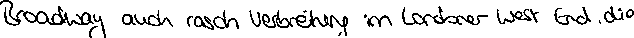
Broadway auch rasch Verbreitung im Londoner West End, die
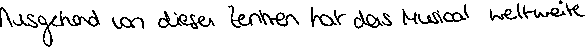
Ausgehend von diesen Zentren hat das Musical weltweite
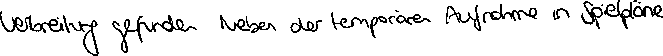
Verbreitung gefunden. Neben der temporären Aufnahme in Spielpläne
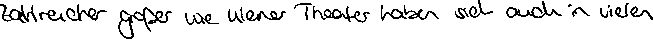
zahlreicher großer wie kleiner Theater haben sich auch in vielen
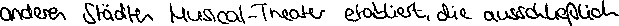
anderen Städten Musical-Theater etabliert, die ausschließlich
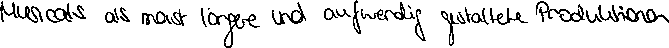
Musicals als meist längere und aufwendig gestaltete Produktionen
